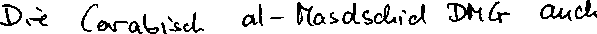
Die (arabisch al-Masdschid DMG auch
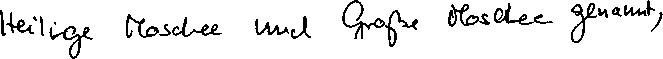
Heilige Moschee und Große Moschee genannt,
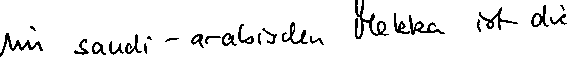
im saudi-arabischen Mekka ist die
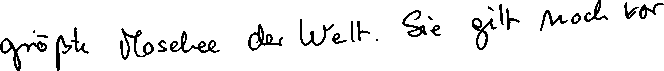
größte Moschee der Welt. Sie gilt noch vor
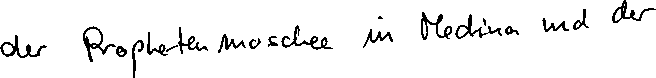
der Prophetenmoschee in Medina und der
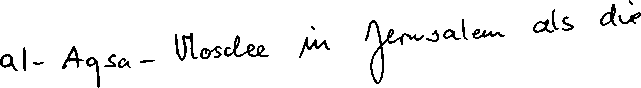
al-Aqsa-Moschee in Jerusalem als die
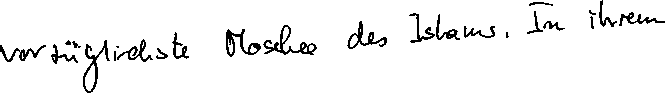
vorzüglichste Moschee des Islams. In ihrem
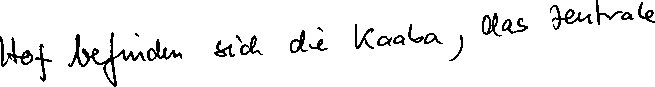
Hof befinden sich die Kaaba, das zentrale
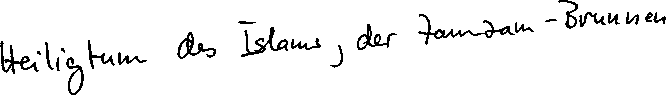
Heiligtum des Islams, der Zamzam-Brunnen
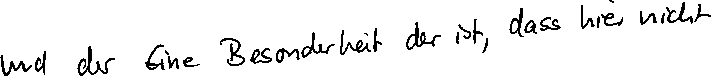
und der Eine Besonderheit der ist, dass hier nicht
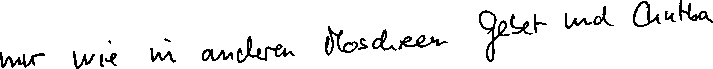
nur wie in anderen Moscheen Gebet und Chutba
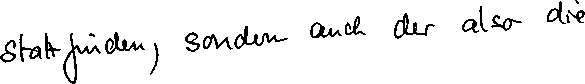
stattfinden, sondern auch der also die
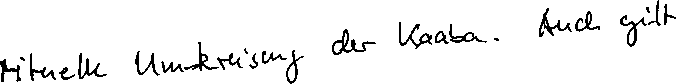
rituelle Umkreisung der Kaaba. Auch gilt
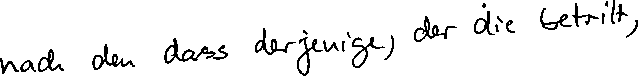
nach den dass derjenige, der die betritt,
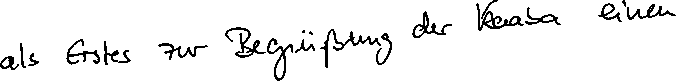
als Erstes zur Begrüßung der Kaaba einen
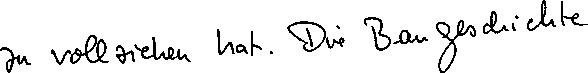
zu vollziehen hat.Die Baugeschichte
